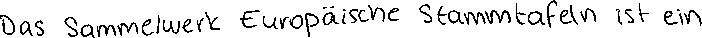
Das Sammelwerk Europäische Stammtafeln ist ein
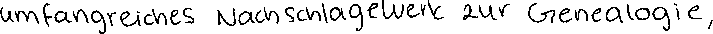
umfangreiches Nachschlagewerk zur Genealogie,
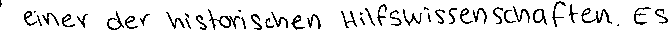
einer der historischen Hilfswissenschaften. Es
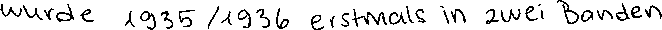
wurde 1935/1936 erstmals in zwei Bänden
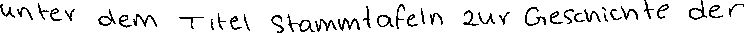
nter dem Titel Stammtafeln zur Geschichte der
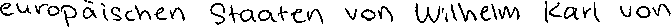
europäischen Staaten von Wilhelm Karl von
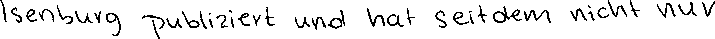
Isenburg publiziert und hat seitdem nicht nur
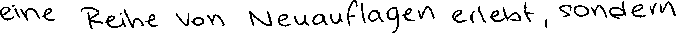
nur eine Reihe von Neuauflagen erlebt, sondern
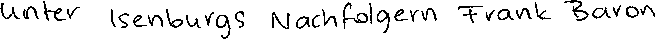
unter Isenburgs Nachfolgern Frank Baron
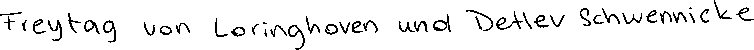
Freytag von Loringhoven und Detlev Schwennicke
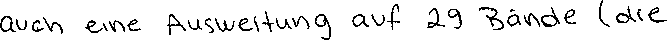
auch eine Ausweitung auf 29 Bände (die
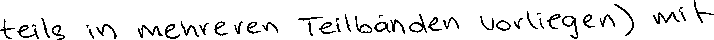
teils in mehreren Teilbänden vorliegen) mit
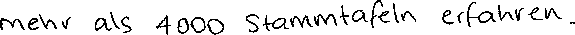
mehr als 4000 Stammtafeln erfahren.
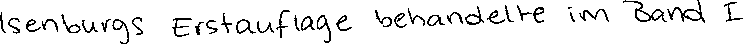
Isenburgs Erstauflage behandelte im Band I
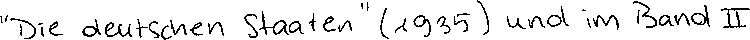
"Die deutschen Staaten" (1935) und im Band II
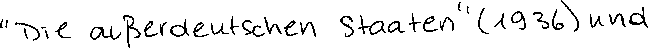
"Die außerdeutschen Staaten" (1936) und
